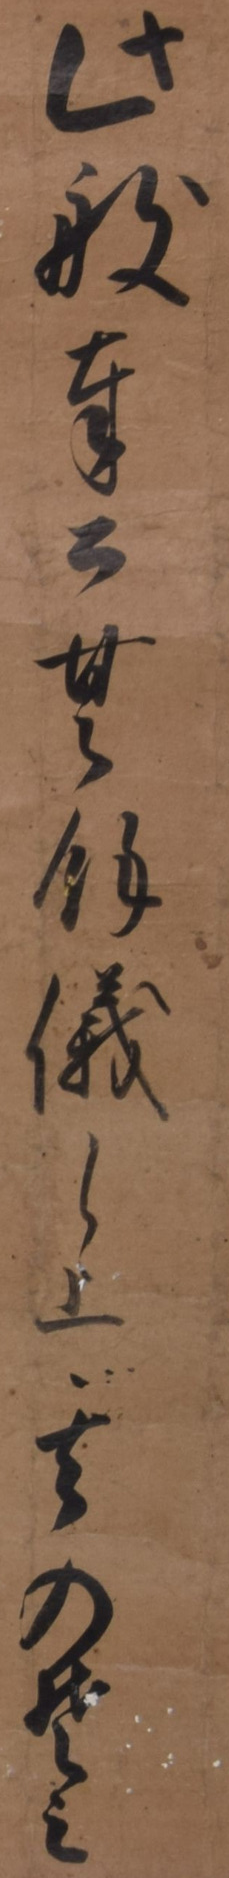此般奉公無余儀之上其のそみ
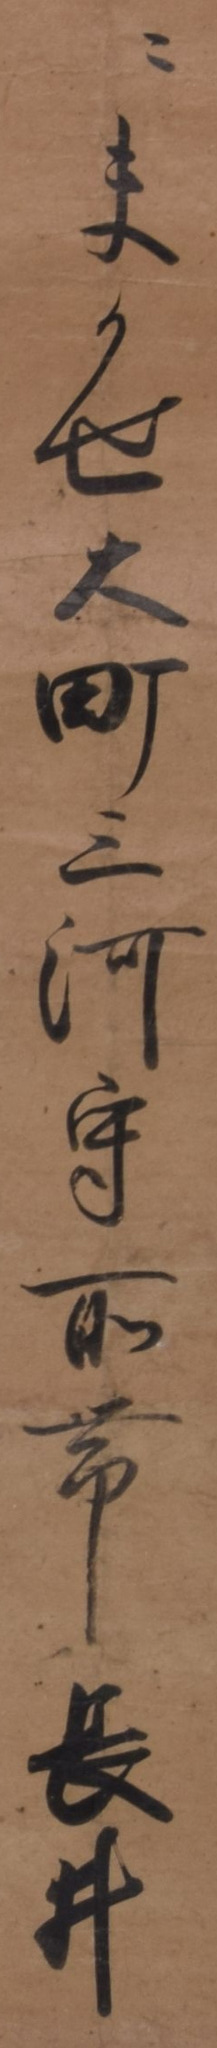にまかせ大町三河守所帯長井
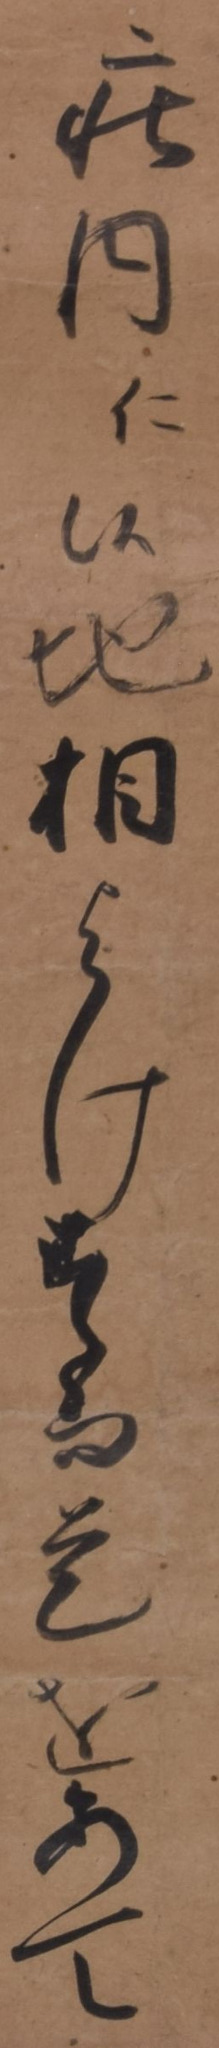庄内に候地相よけす而是をあて
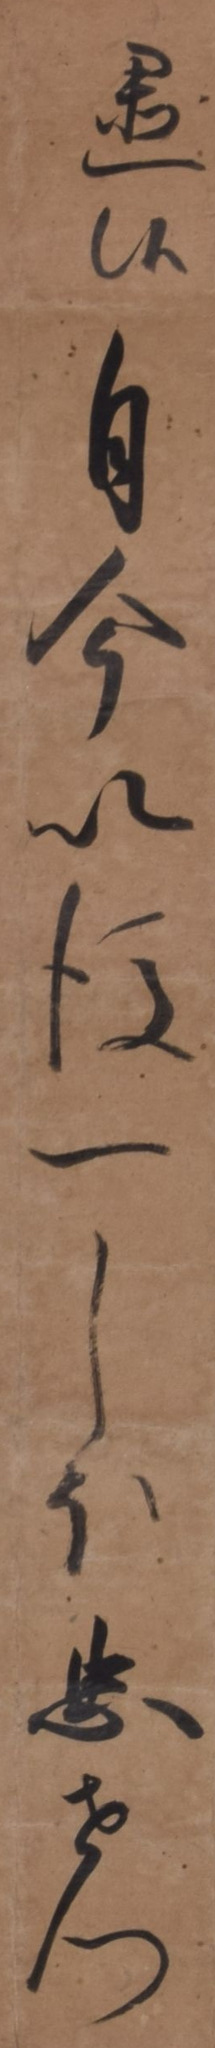置候自今以後一しほ忠せつ
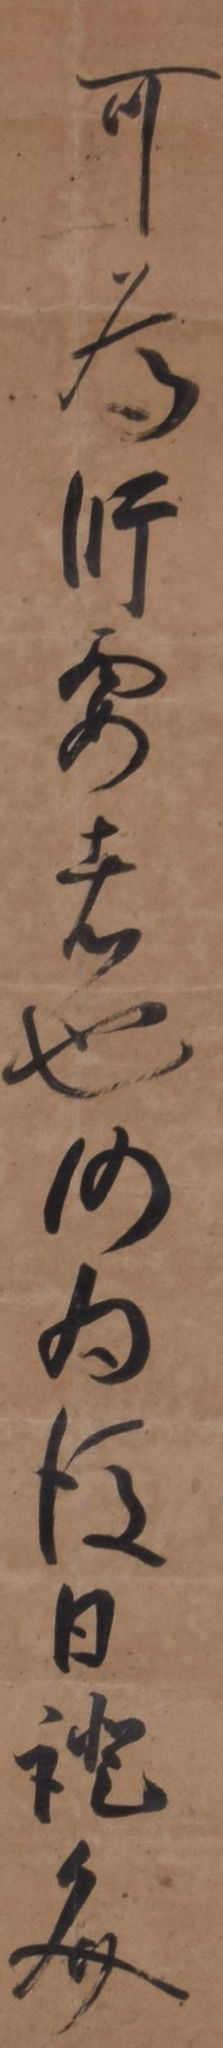可為肝要者也仍為後日証文
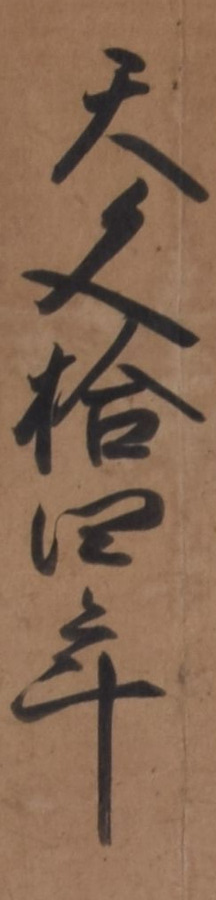天文拾四年
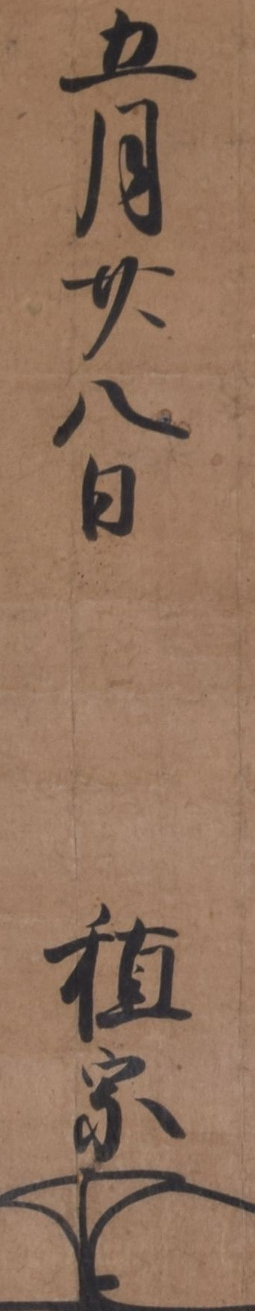五月廿八日植宗
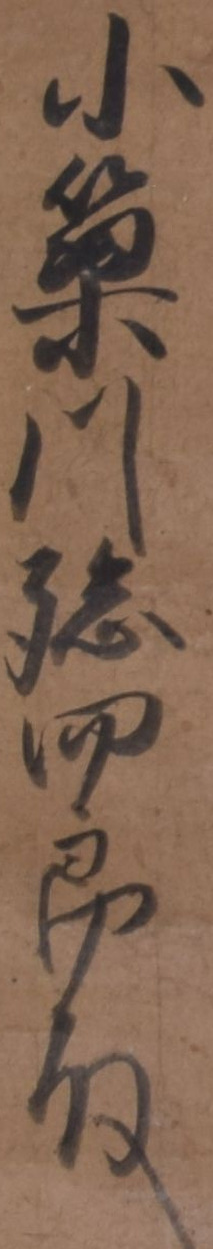小築川孫四郎殿
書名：伊達稙宗書下（小梁川孫四郎）
